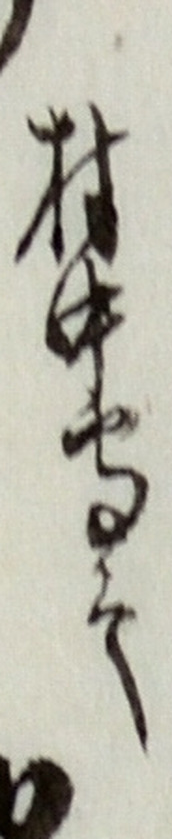村中守之
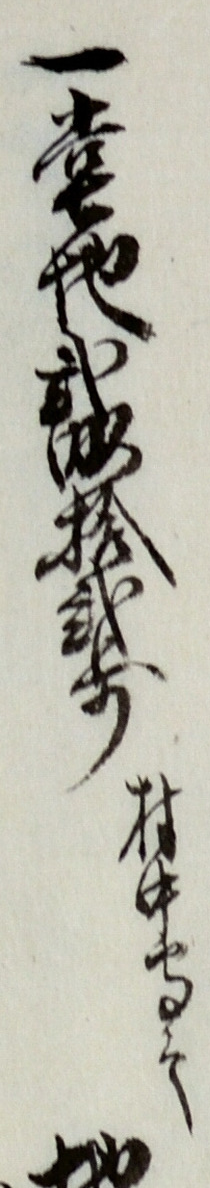一堂地弐畝拾弐歩地蔵
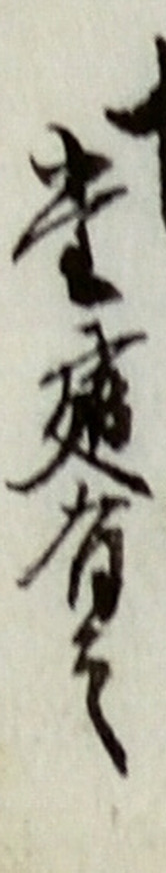堂建有之
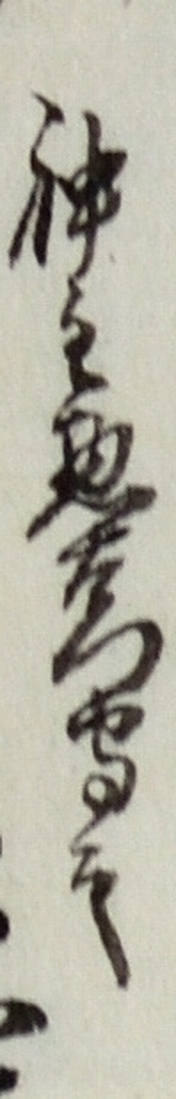神主惣右衛門守之
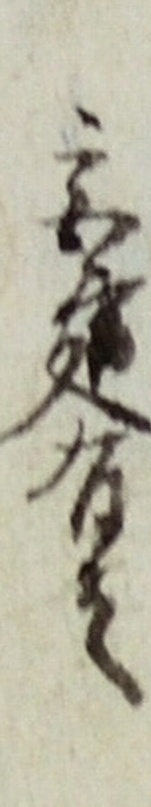宮建有之

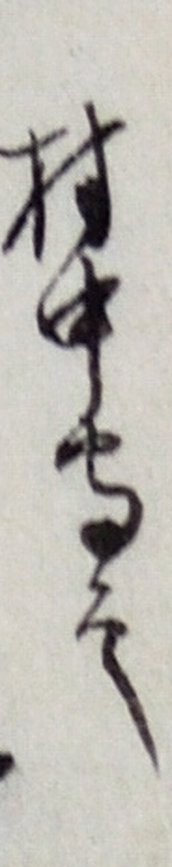村中守之
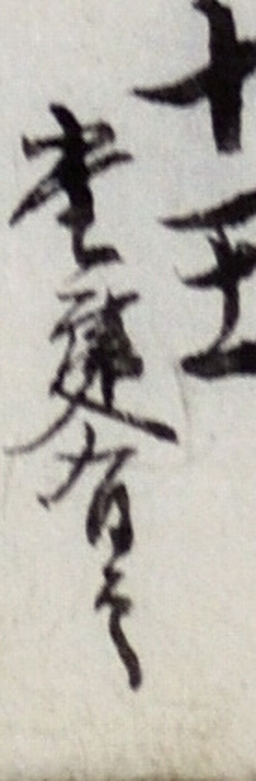堂建有之
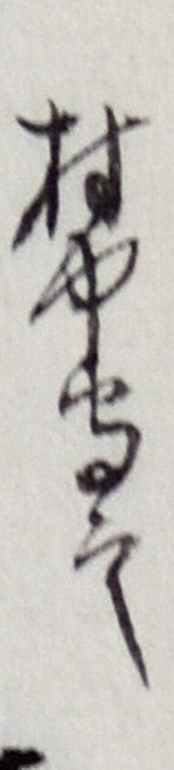村中守之
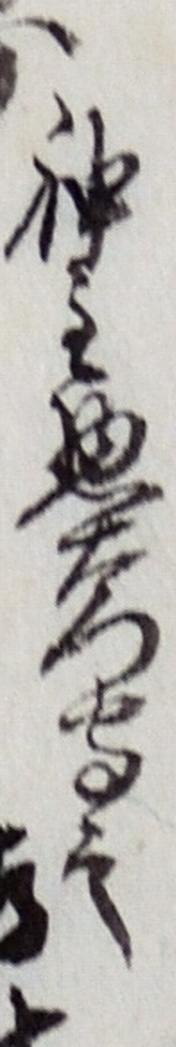神主惣右衛門守之
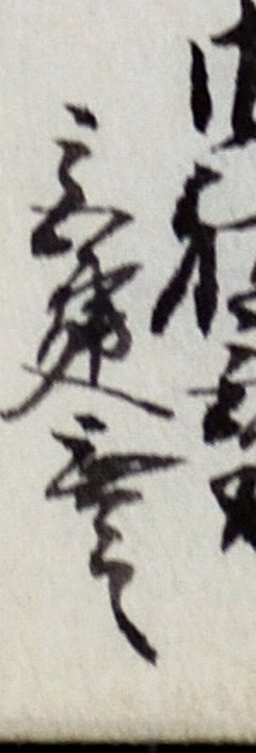宮建無之
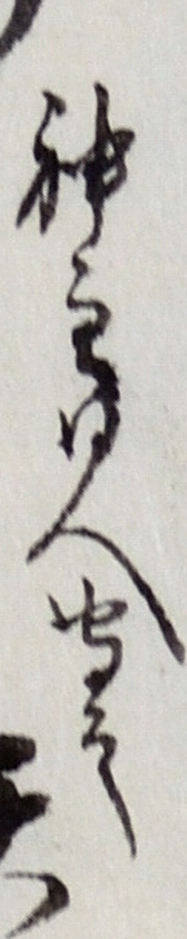神主同人守之
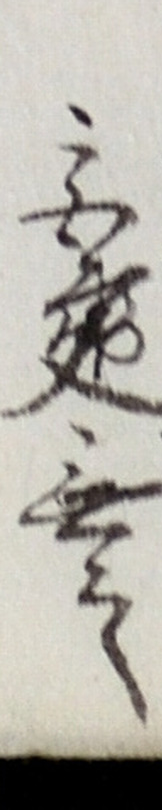宮建無之
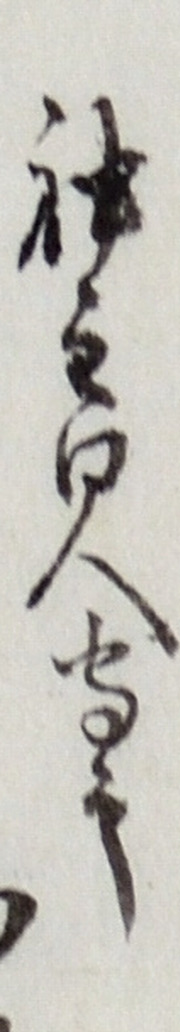神主同人守之
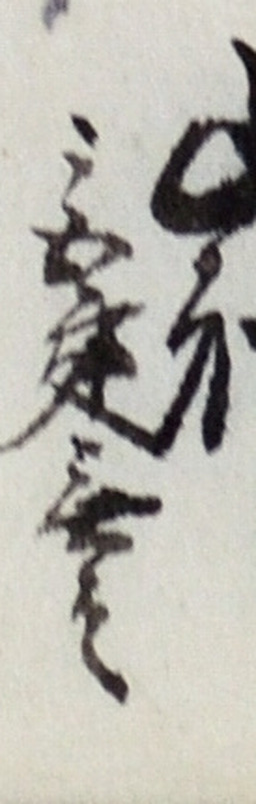宮建無之
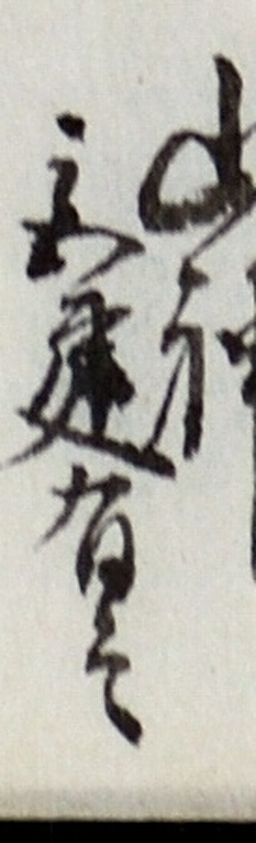宮建有之
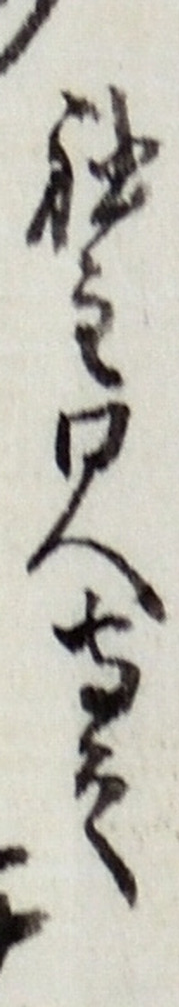神主同人守之
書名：御領分中山林社地手控
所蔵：伊那市立高遠町図書館・合同会社AMANE
